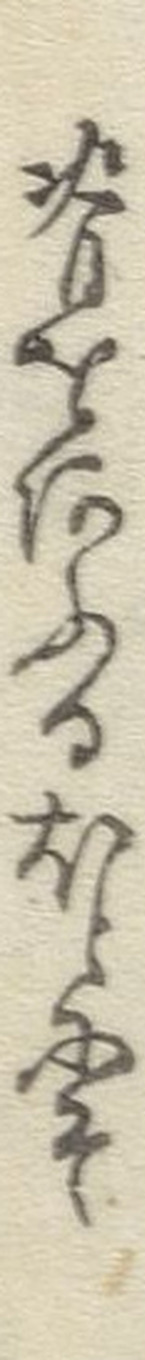背をあふるほとにそ
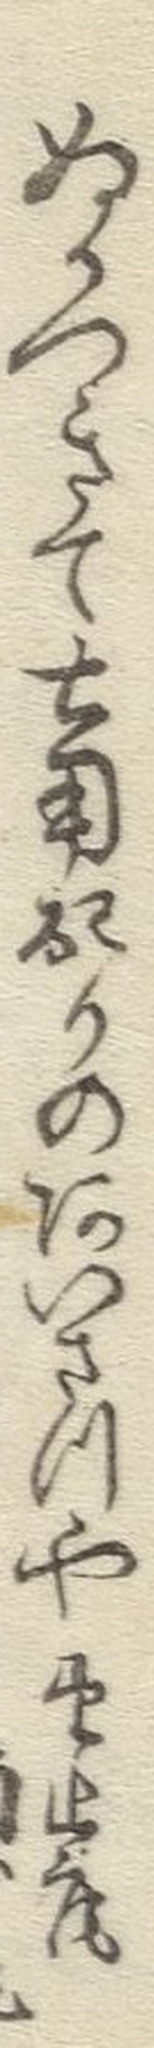ぬかつきて土用配りのあいさつや望止庵
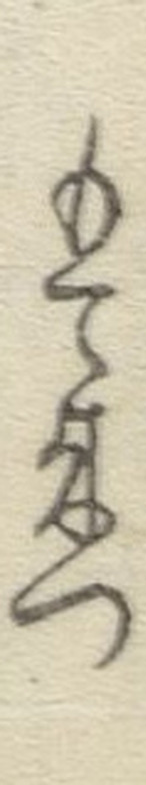もて来つ
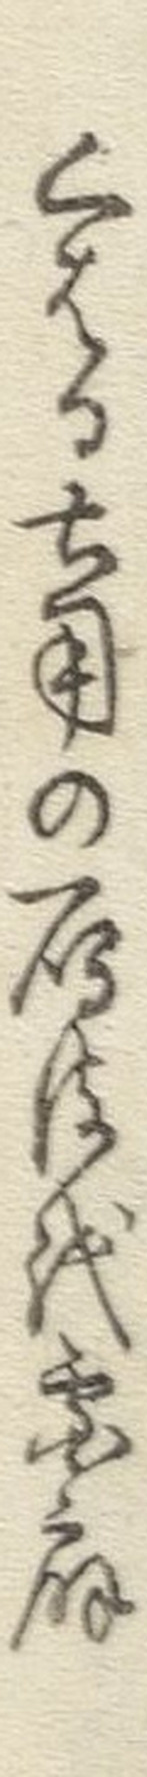くはる土用の雁皮紙団扇
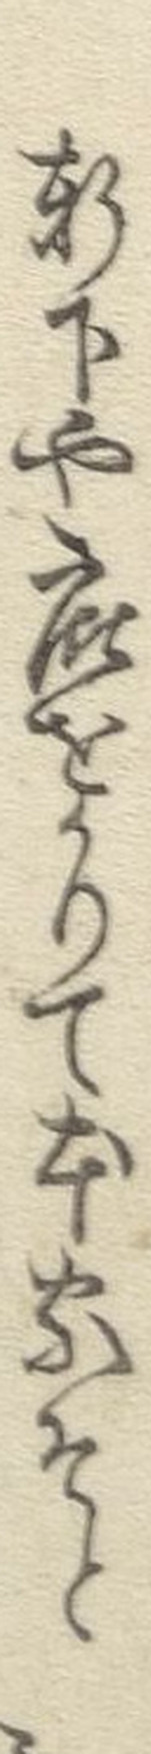軒下や庇をかりて本家そと望止庵
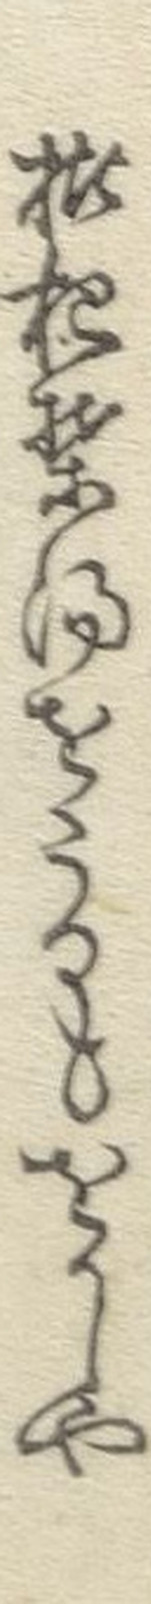琵琶葉湯をうるもをかしや貞丸
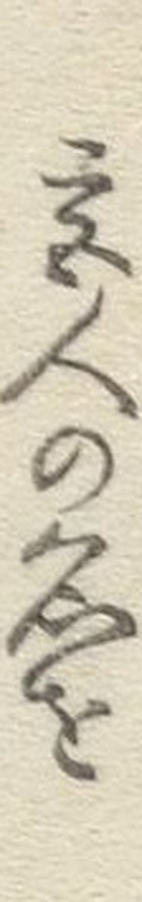宮人の名を
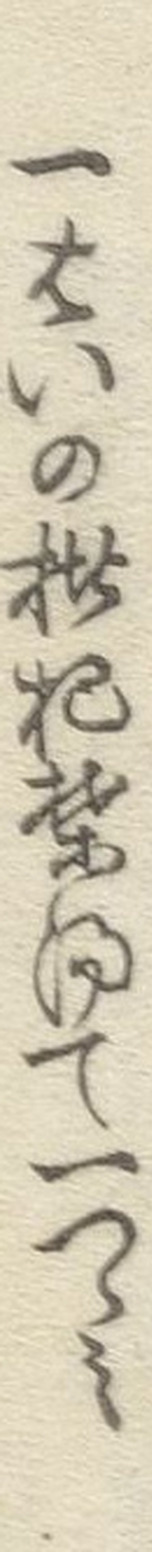一はいの琵琶葉湯て一つゝみ
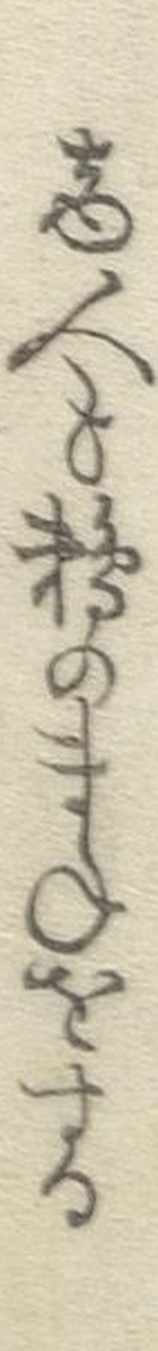商人も鵜のまねをする
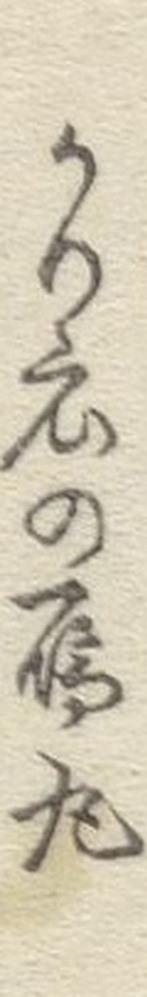うり衣の烏丸
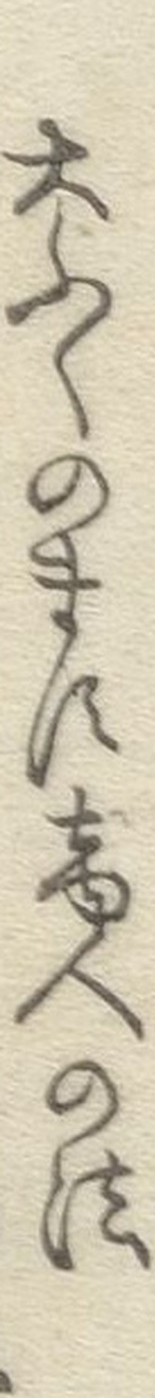大ふくのます商人の方
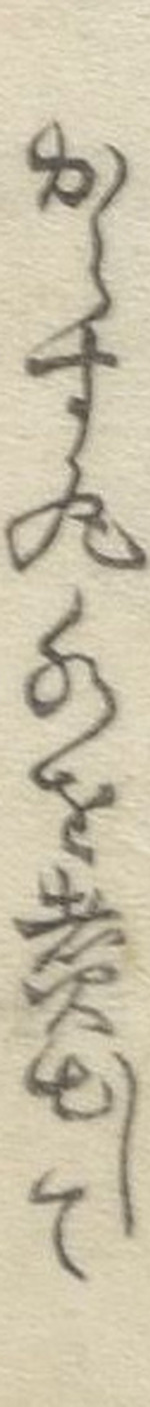からす丸水を煮出して
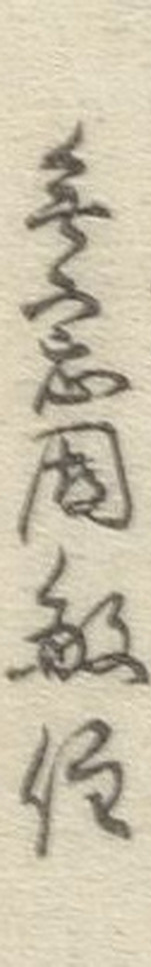無窓園敏住
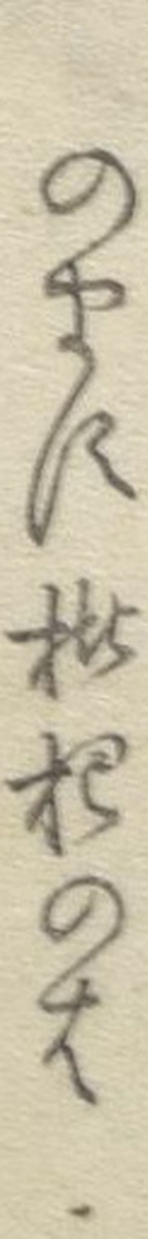のます琵琶のは
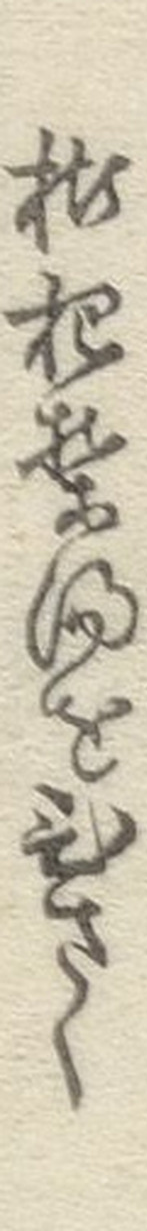琵琶葉湯をひさく
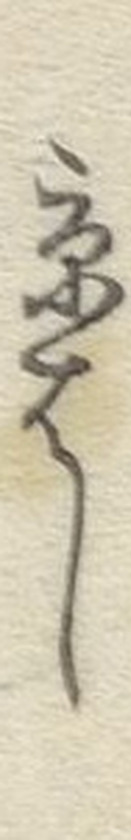京はし
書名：Picture Album of People with Kyōka (Light Verse) (Kyōka shiki jinbutsu 狂歌四季人物)
